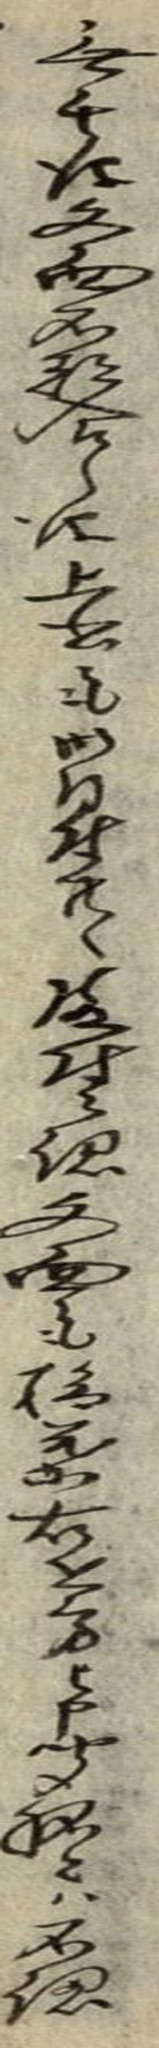無其儀文面不都合之儀上書にも御目付共へ殿付と認文面にも稻葉右近方被申聞猥には不認
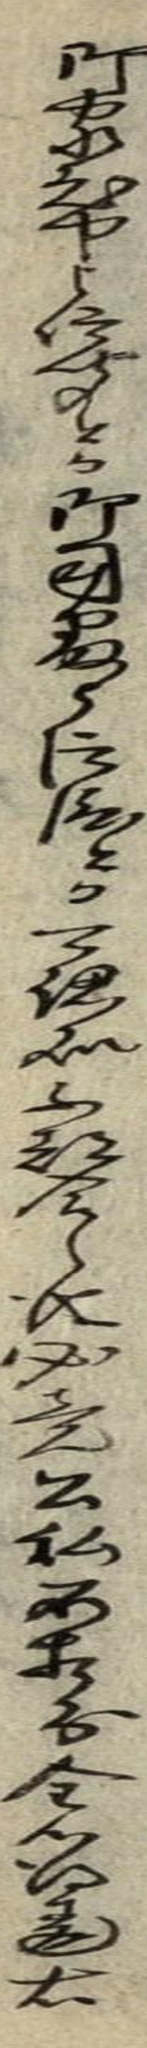御家老中被仰聞とか御用番被仰渡とか可認候処不都合之儀必竟公私不相分全心得違右
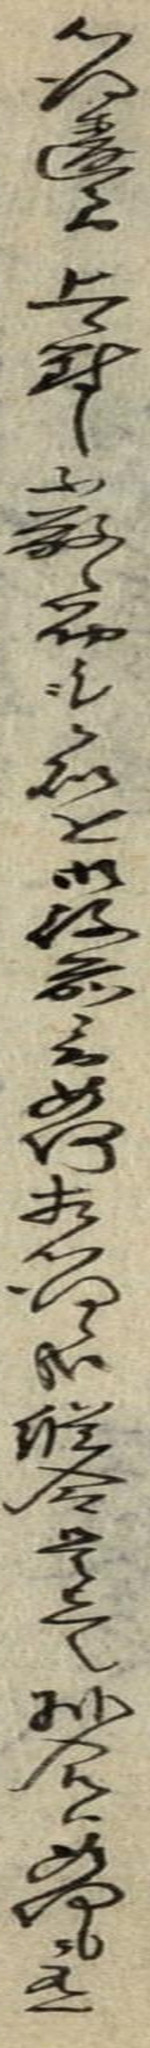心得違とは上に対し不敬之筋にも候処と御役前に而如何相心得候哉縦令是迄之掛合は如何も有
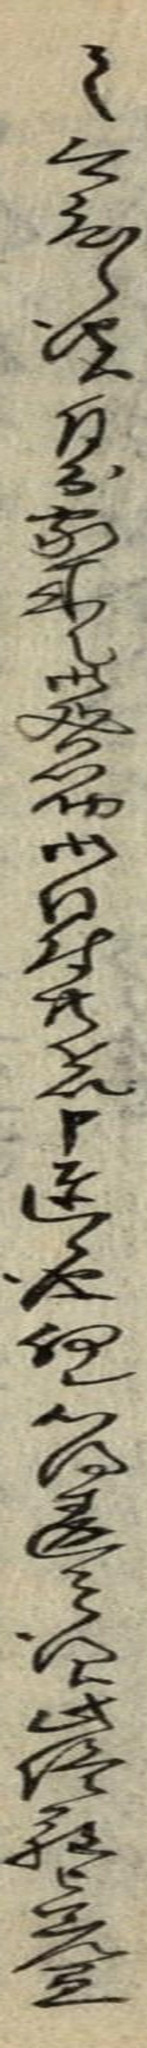之今度之儀は自分家来之御咎筋御目付共を以申達候儀何れ心得違に候得は此侭難被差置
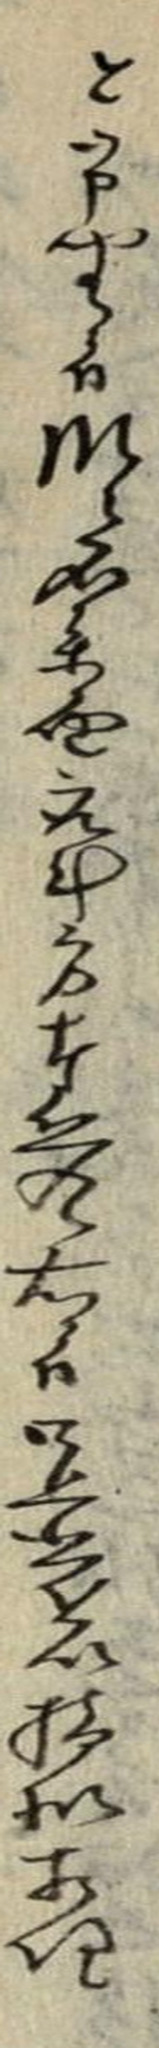と御申聞候に付段々不参届取斗方奉恐入候右に付口上書を以指扣相伺候
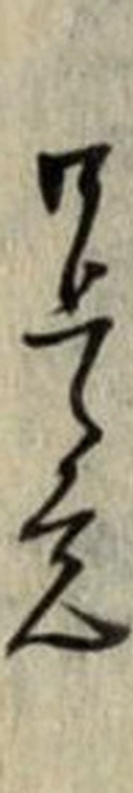口上之覚
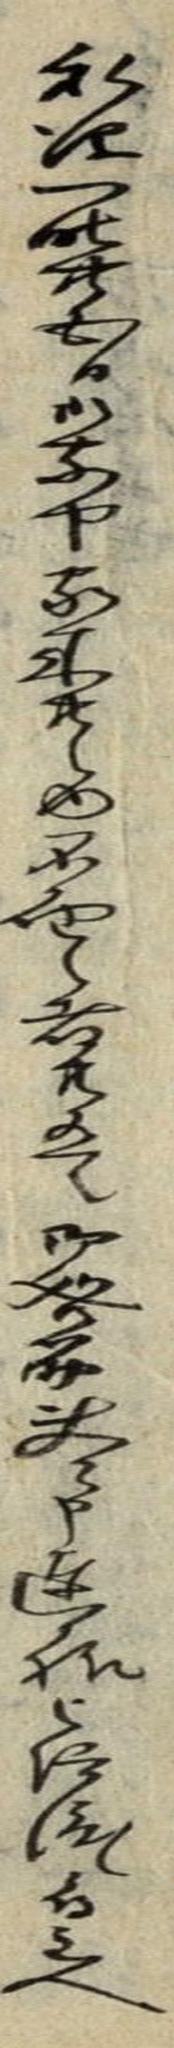私儀一昨廿五日御家中家来共之内不届之者共有之御咎筋夫々申達候様被仰渡候に付主人
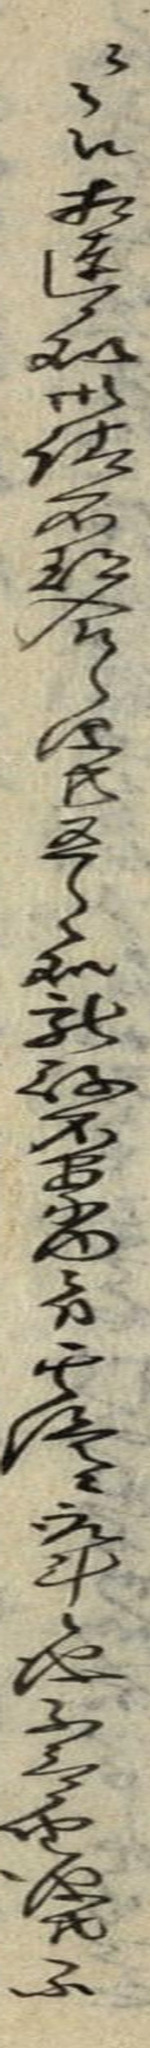〃〃江相達候処御請不都合之儀共有之候処新役不案内に付其侭に取斗候儀不参届候儀共不
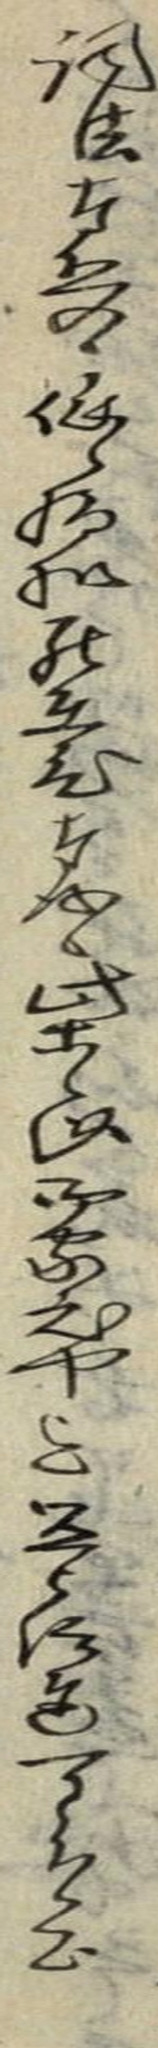調法奉恐入候依之指扣罷在度奉存候此等之趣御家老中迄宜被仰達可被下候以上
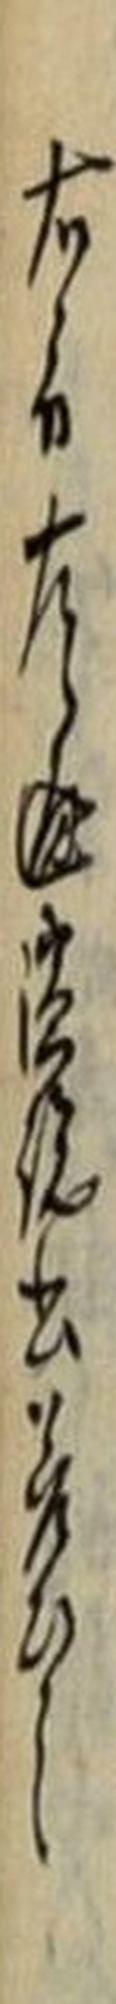右に付左之通演説書差出之
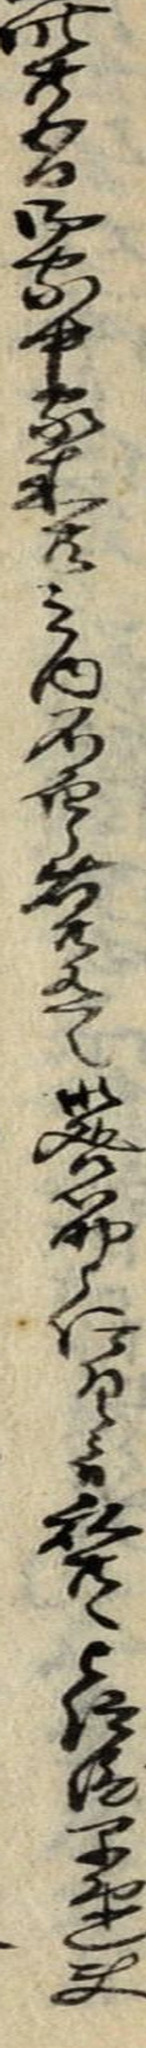一昨廿五日御家中家来共之内不届之者共有之御咎筋被仰付候に付私共へ被仰渡早速夫
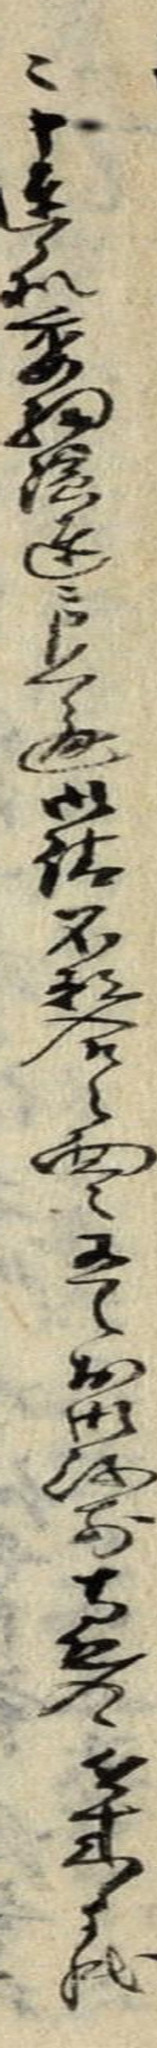々申達候処委細認速に申上候通御請不都合之面々有之於御役前奉恐入候近来手紙
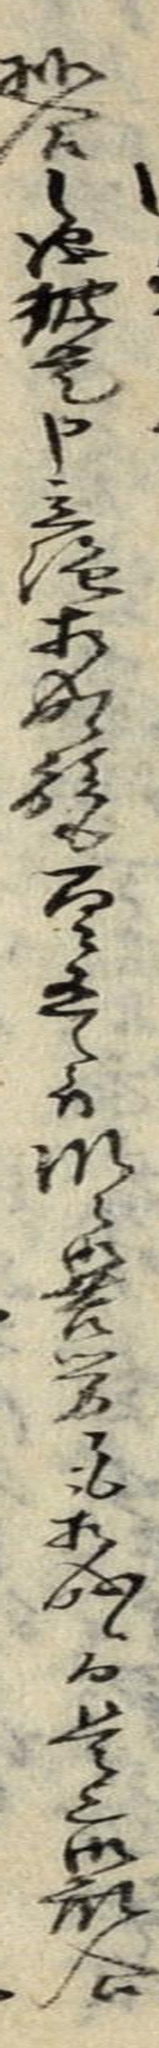掛合之儀彼是申立強相成候族も間々有之候に付段々御苦労にも相成候而是迄御都合
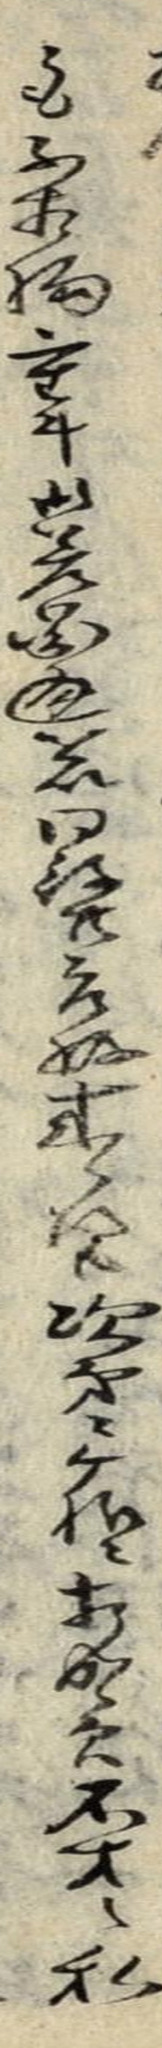にも不相拘重き御差図通を以同役共取扱来候得共次第にヶ様に相成候而は不才之私
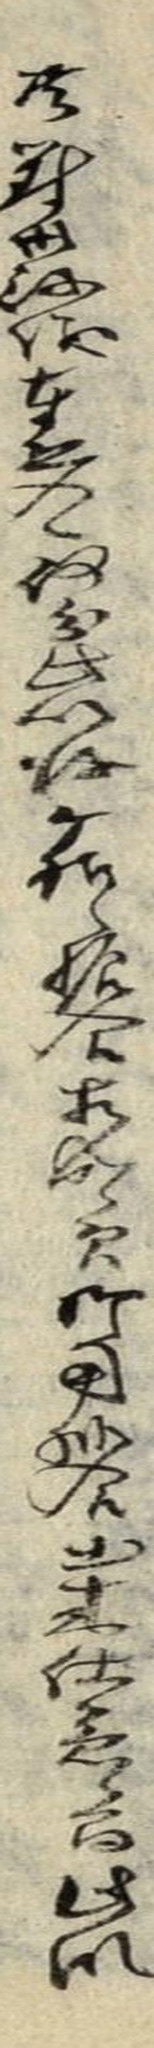共対御役儀奉恐入候何分此以後ヶ様之振合相成候而は御用掛合出来仕兼候間此段
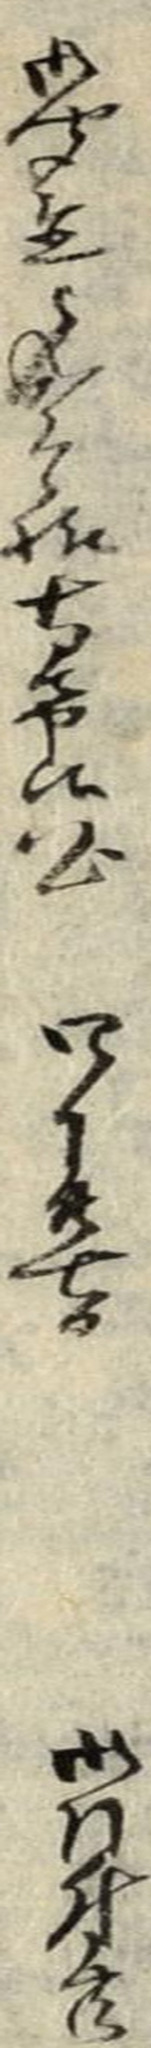御聞置被成被下候様奉希候以上四月廿七日御目付共
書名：蒐輯之部
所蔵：福井県文書館 Fukui Prefectural Archives
